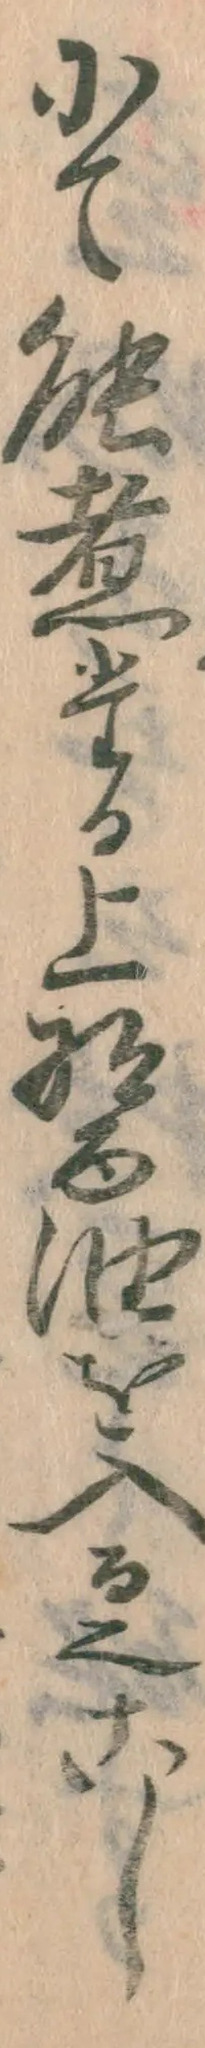にて能煮たる上醤油を入る也こし
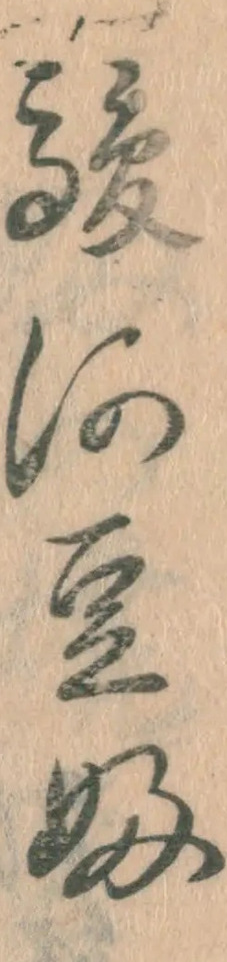駿河豆ふ
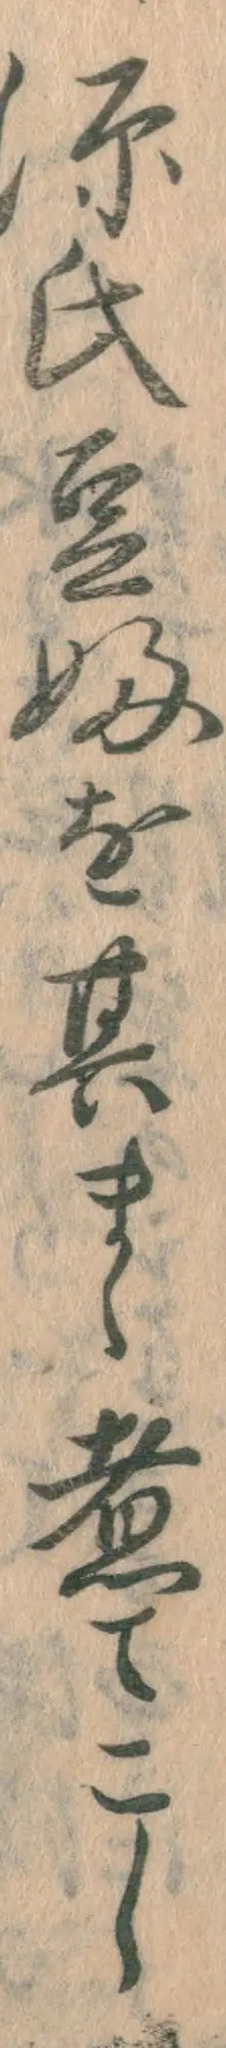源氏豆ふを其まゝ煮てこし
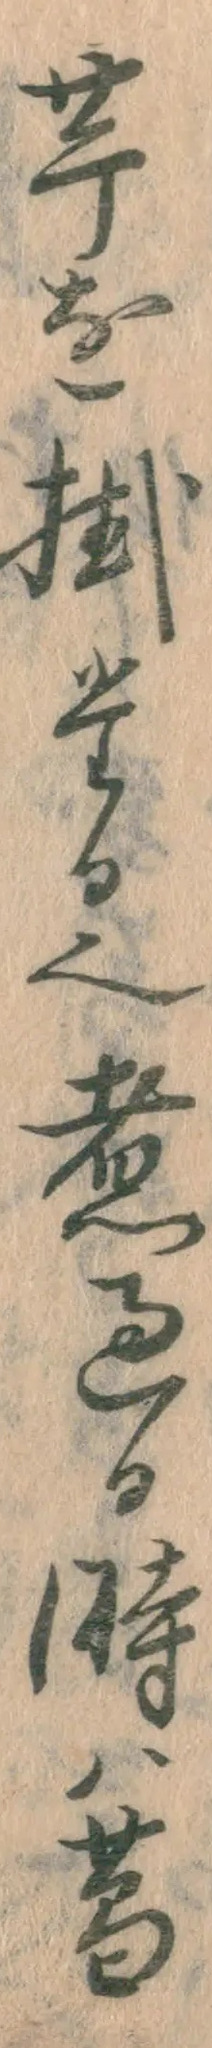芋を掛たる也煮過る時は葛
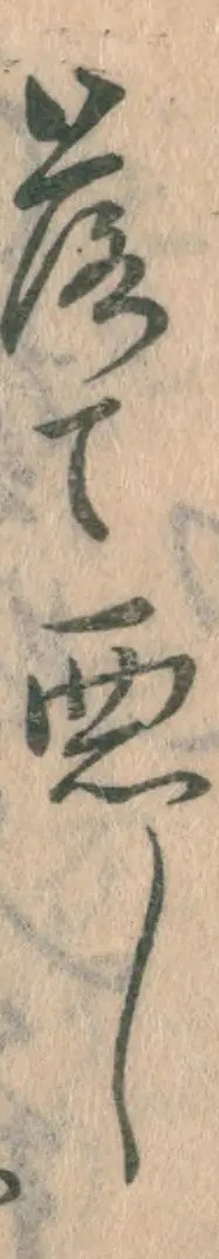落て悪し
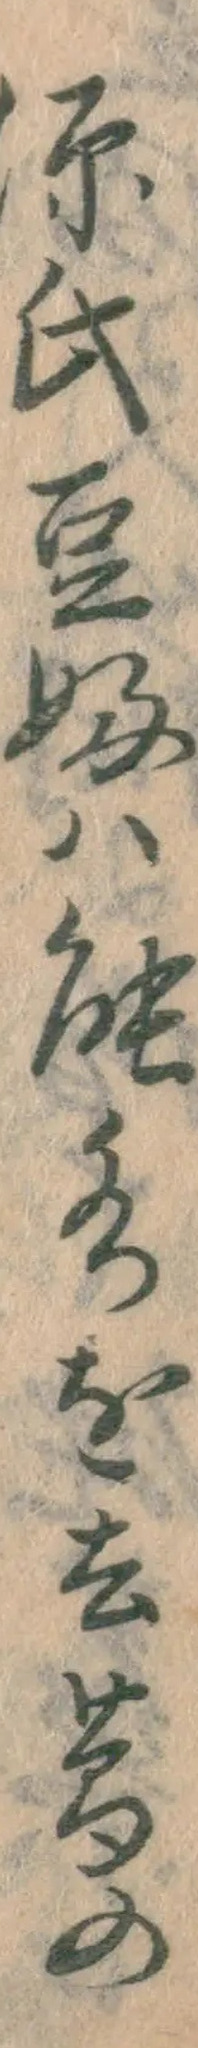源氏豆ふは能水を去葛の
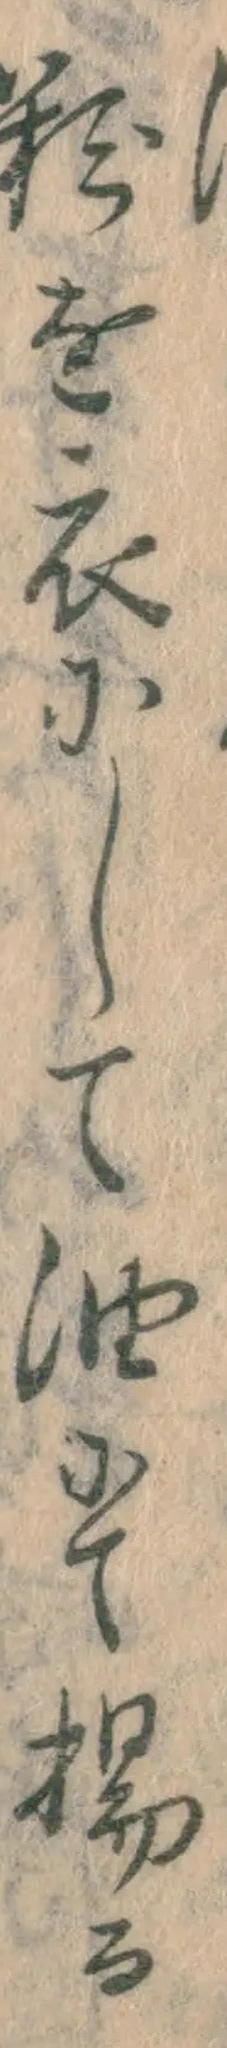粉を衣にして油にて揚る
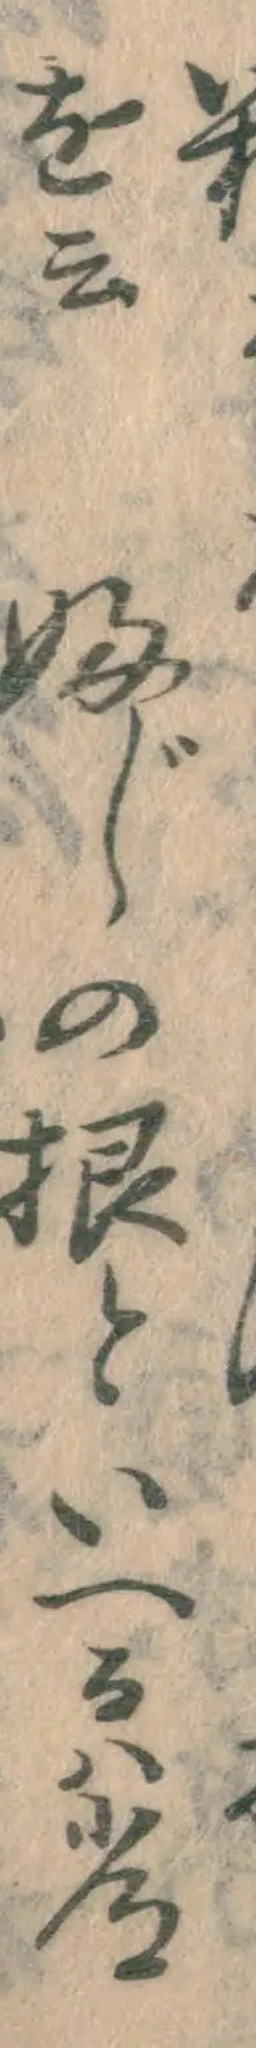を云ふじの根といへるは常
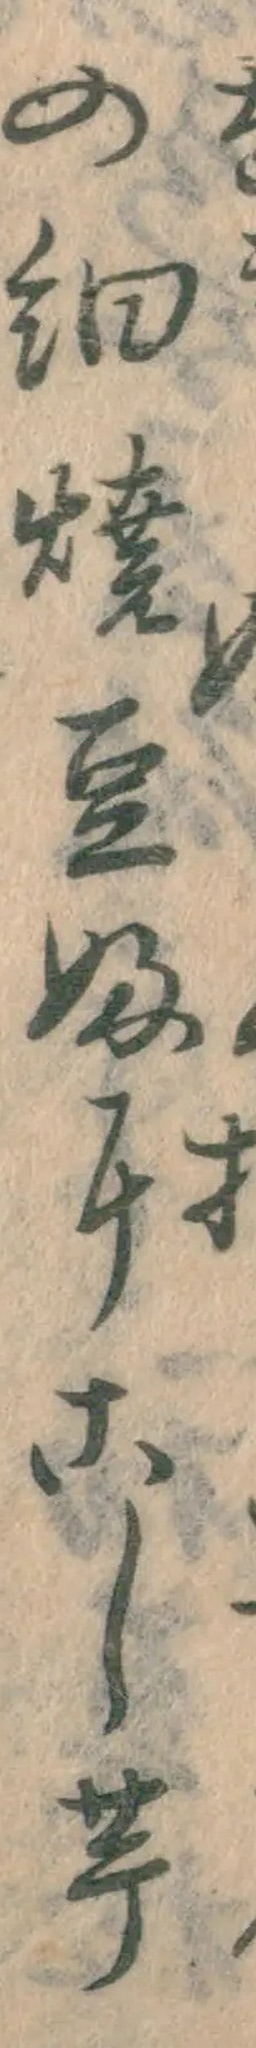の細焼豆ふにこし芋
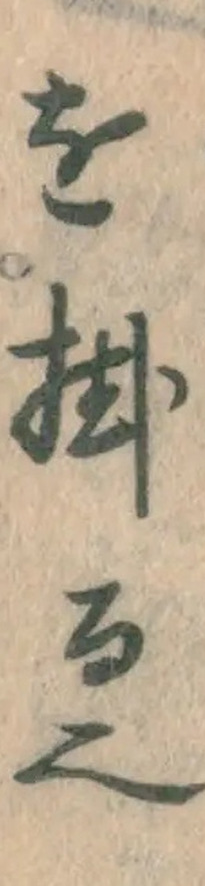を掛る也

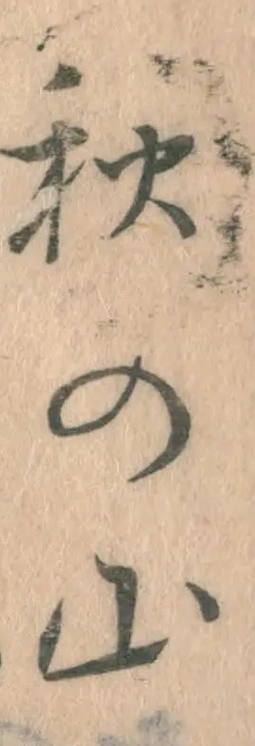秋の山
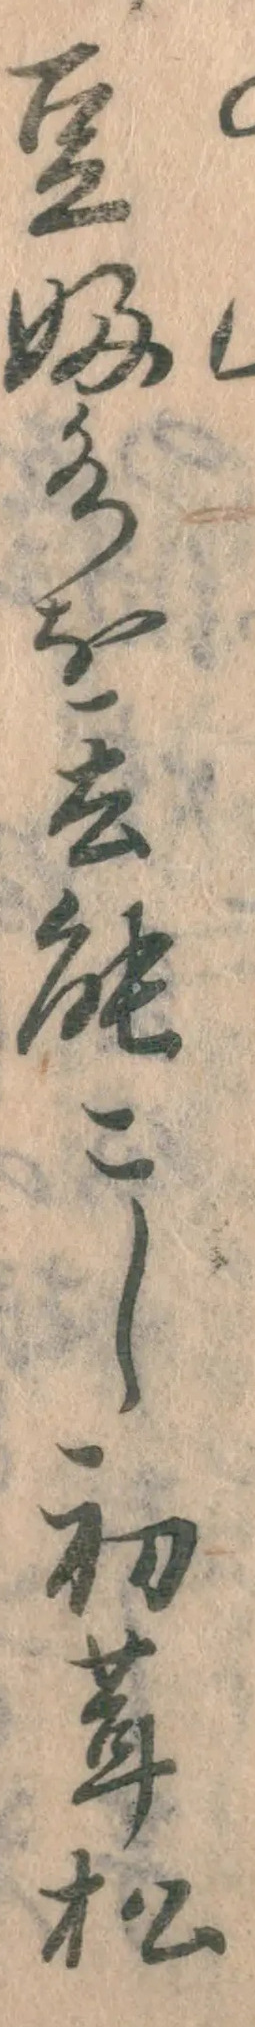豆ふ水を去能こし初茸松
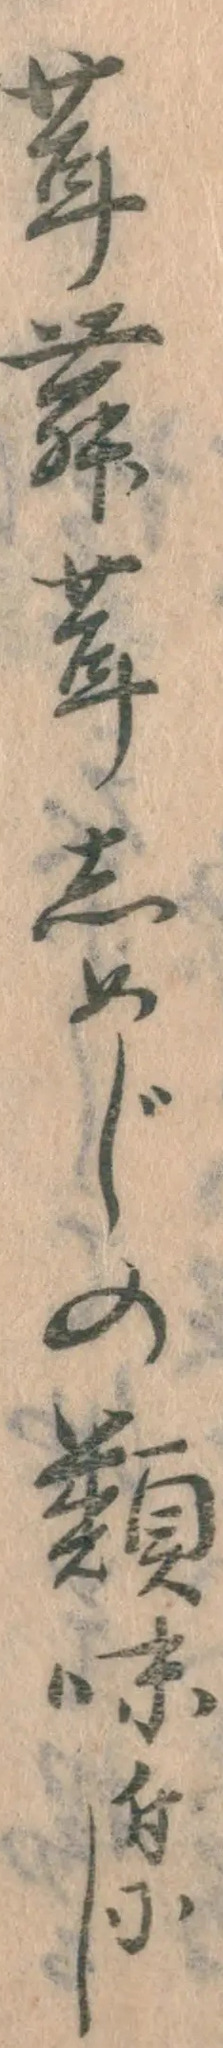茸舞茸しめじの類味付にし
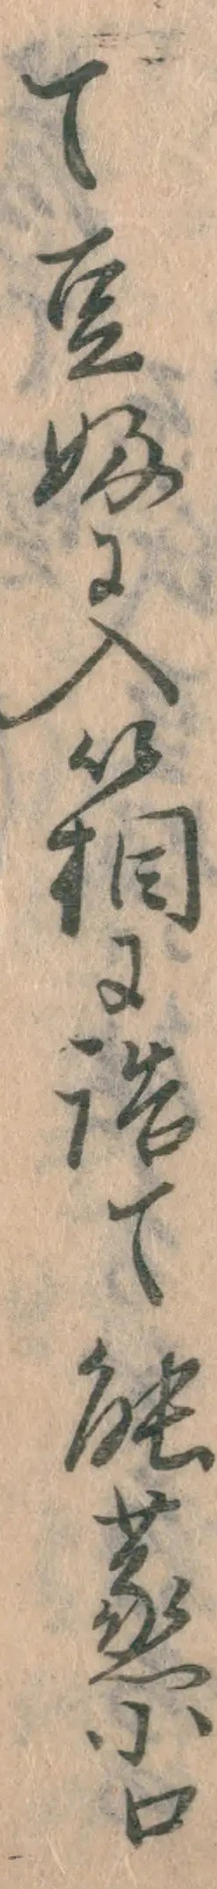て豆ふに入箱に詰て能蒸小口
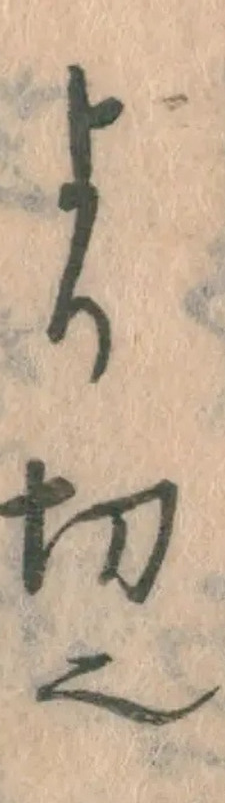より切也
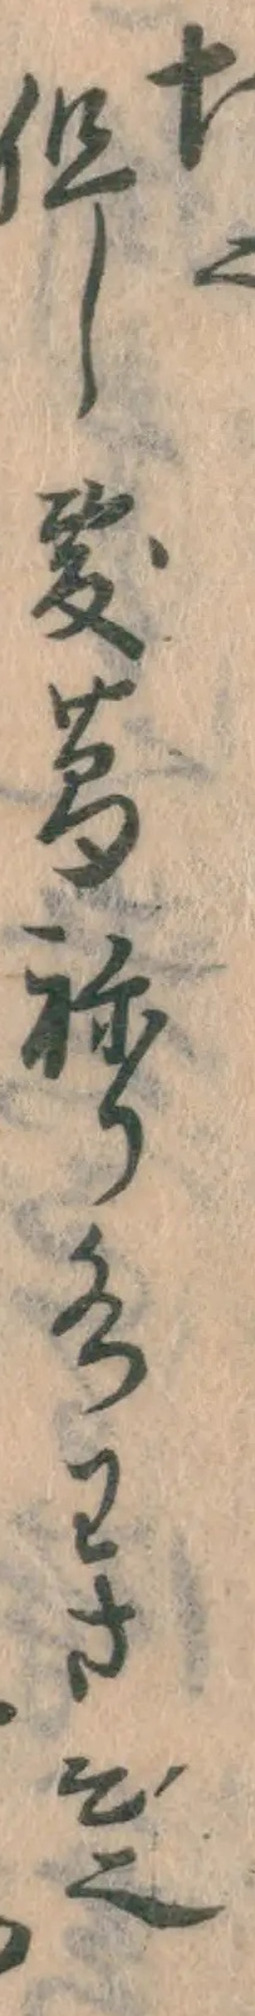但し敷葛ねり水わさひ也
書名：豆腐百珍余録
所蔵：国立国会図書館 National Diet Library, JAPAN
